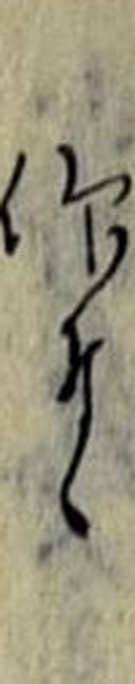仰付候
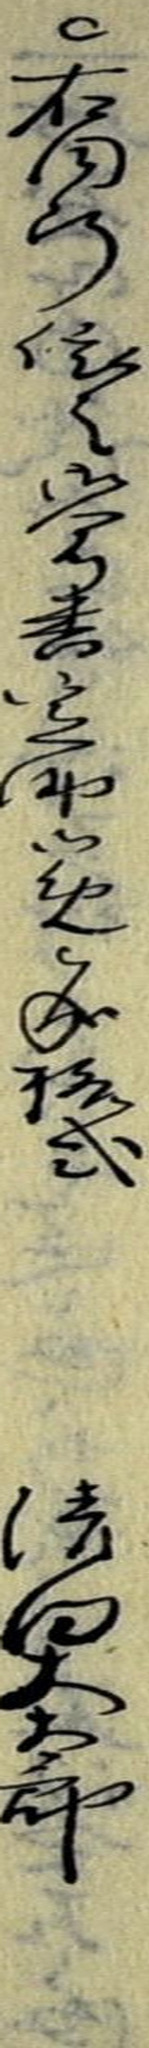〇右同断依之御聞番定助御免被成格式清田丈太郎
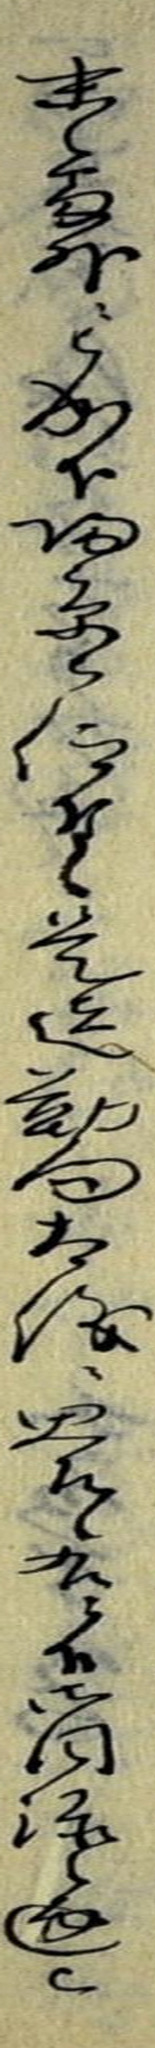末之番外に被成下帰参京被仰付候是迄勤向太儀に思召候右に付御目録之通被
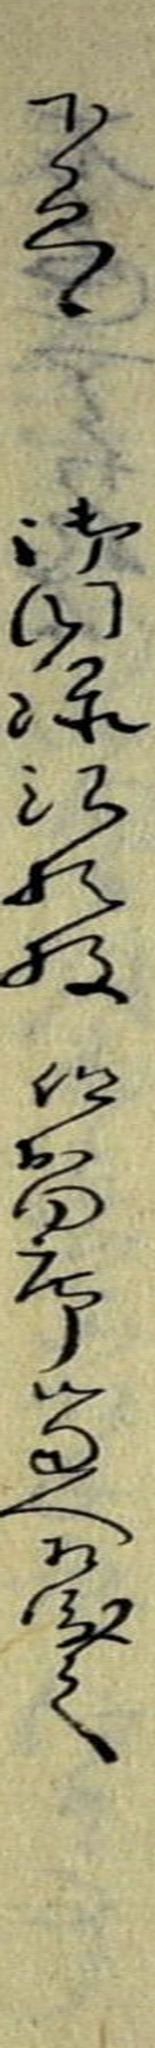下置候御目録銀拾枚但於同席御用人相渡之
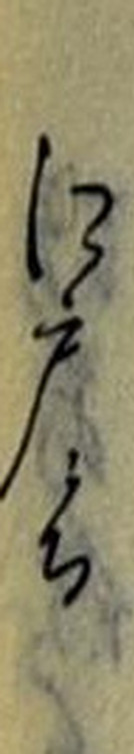江戸に而
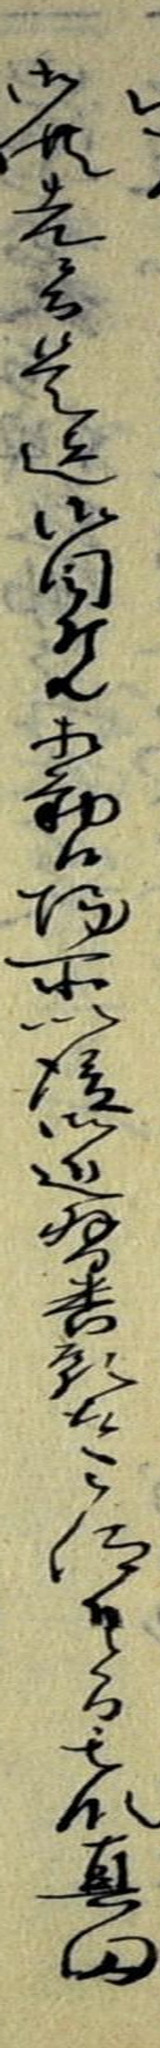御供先に而是迄御目付共相勤候場所以後御近習番頭取へ被仰付候間其段真田
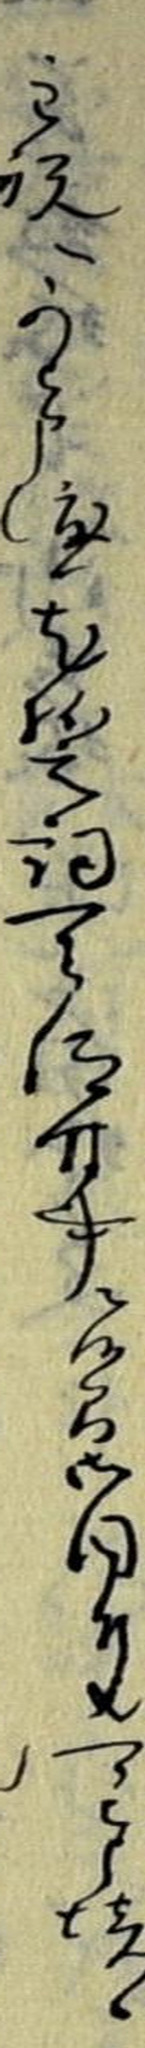主税へ可被申渡候尤誓詞可被仰付事に候間御目付共可被申談候
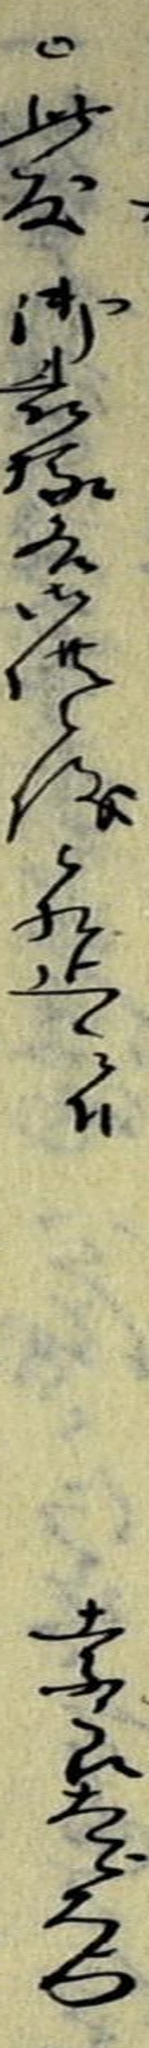〇此度御表様各御供之儀被相止候に付奈良太郎右衛門
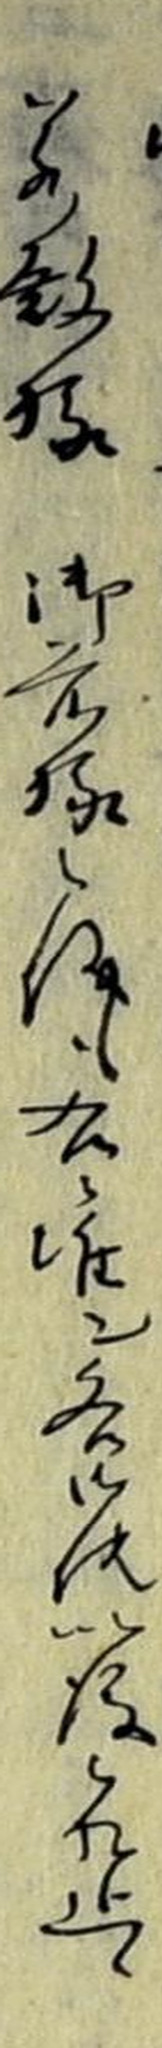若殿様御前様之儀も右に准し各御供以後被相止候
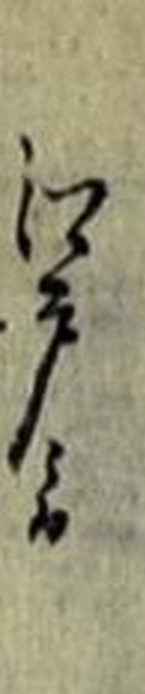江戸に而
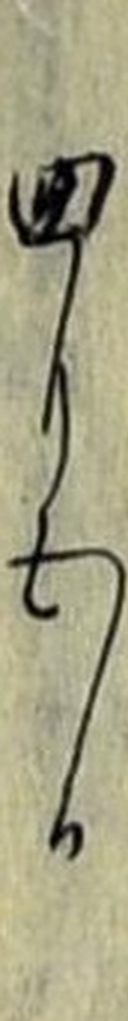四月五日
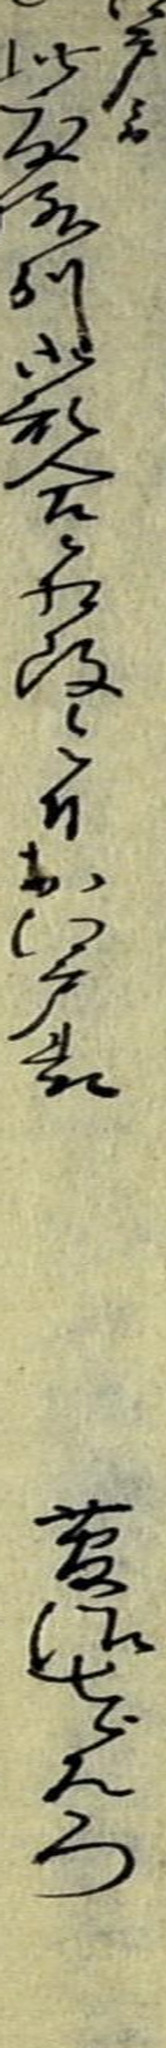〇此度格別御形合被相改候に付於江戸表菅沼七郎右衛門
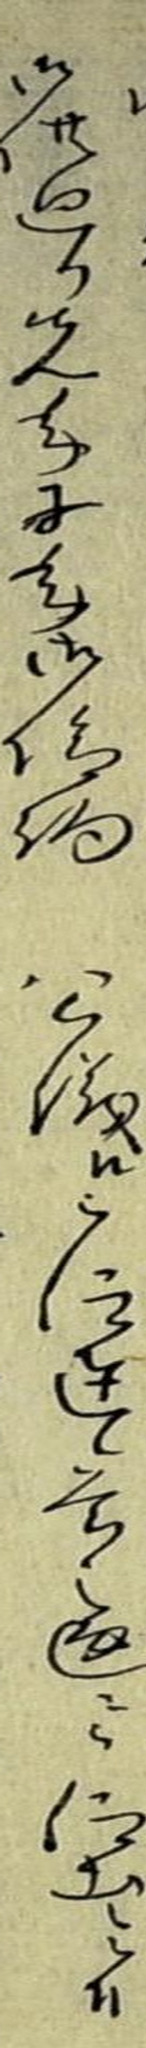御供廻り先年刁年御倹約公儀え被仰達候節之通に被仰出候に付
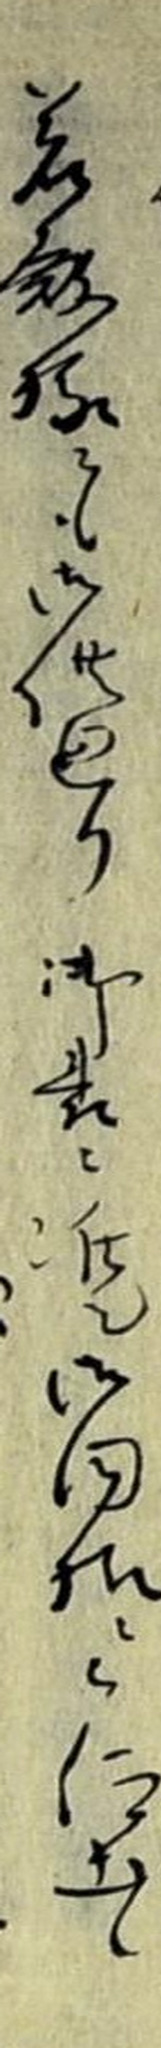若殿様にも御供廻り御表に准し御同様に被仰出候
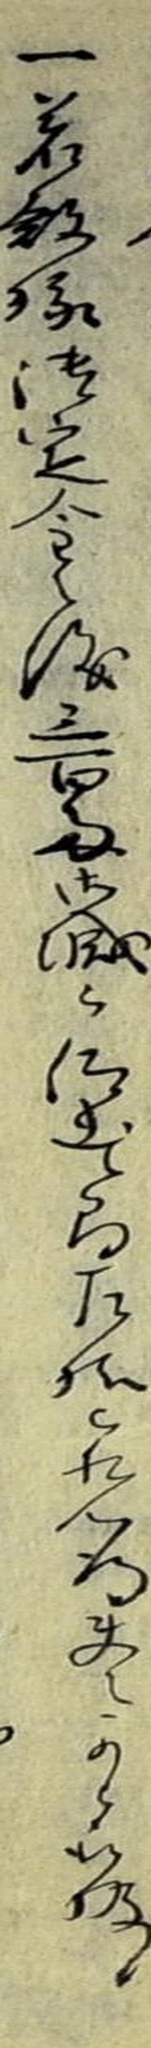一若殿様御定金之儀三百両御減被仰出候間左様被相心得夫々可被取扱候
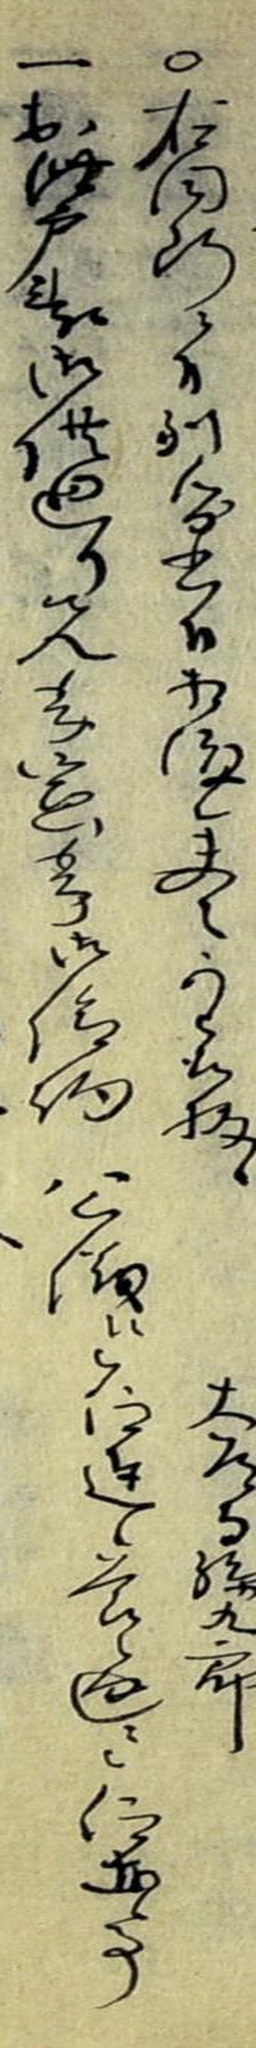一於江戸表御供廻り先年寅年御倹約公儀え被仰達候節之通に被仰出候事
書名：命令之部 二
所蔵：福井県文書館 Fukui Prefectural Archives
